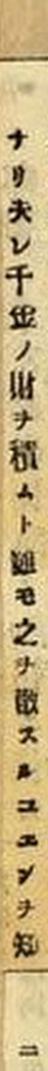ナリ夫レ千金ノ財ヲ積ムト雖モ之ヲ散スルユエンヲ知

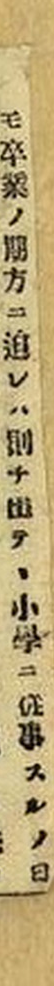モ卒業ノ期方ニ迫レハ則チ出テ小学ニ従事スルノ日
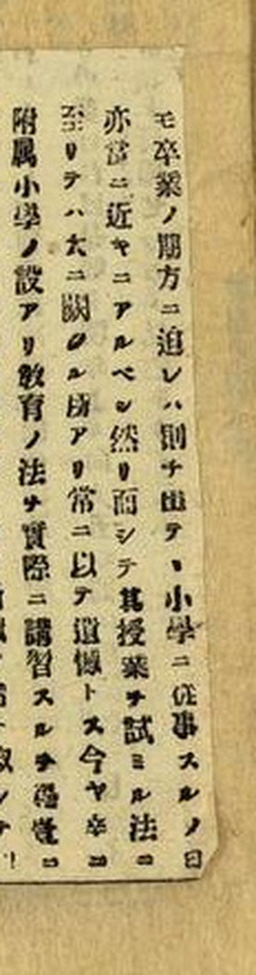亦当ニ近キニアルベシ然リ而シテ其授業ヲ試ミル法ニ
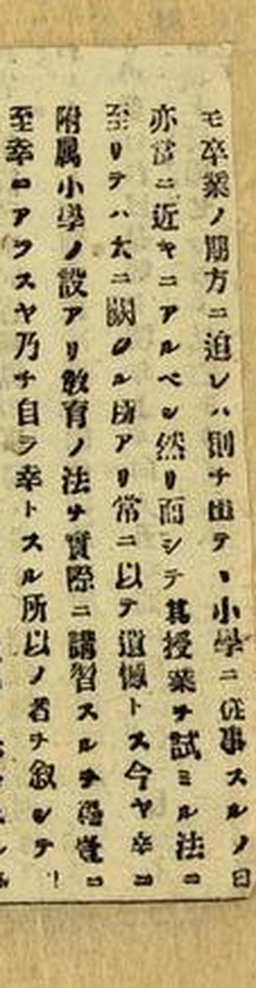至リテハ大ニ闕クル所アリ常ニ以テ遺憾トス今ヤ幸ニ
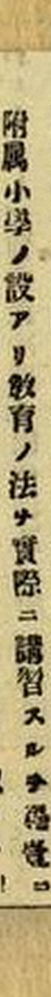附属小学ノ設アリ教育ノ法ヲ実際ニ講習スルヲ豈ニ
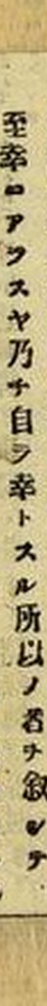至幸ニアラスヤ乃チ自ラ幸トスル所以ノ者ヲ叙シテ以
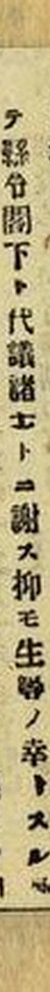テ県令閣下ト代議諸士トニ謝ス抑モ生等ノ幸トスル所
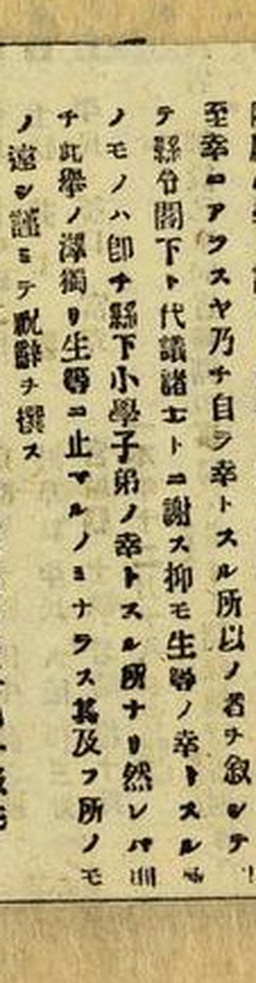ノモノハ即チ県下小学子弟ノ幸トスル所ナリ然レバ則
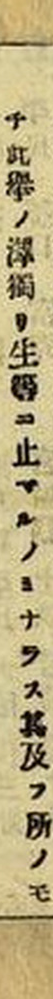チ此挙ノ澤独リ生等ニ止マルノミナラス其及フ所ノモ
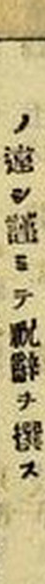ノ遠シ謹ミテ祝辞ヲ撰ス
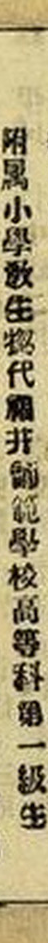附属小学教生惣代福井師範学校高等科第一級生
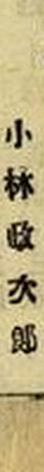小林政次郎
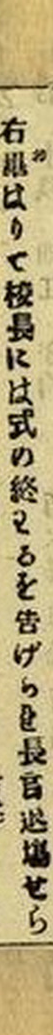右畢はりて校長には式の終わるを告げられ長官退場せら
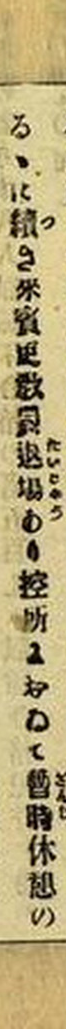るゝに続き来賓吏教員退場あり控所におゐて暫時休憩の
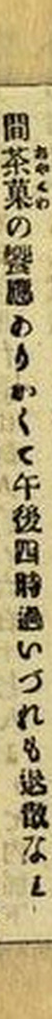間茶菓の饗応ありかくて午後四時過いづれも退散なし
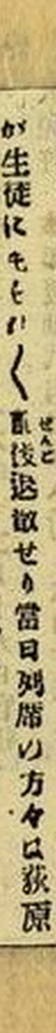が生徒にもそれ〳〵前後退散せり当日列席の方々は萩原
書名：温古集 五巻
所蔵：福井県文書館 Fukui Prefectural Archives
